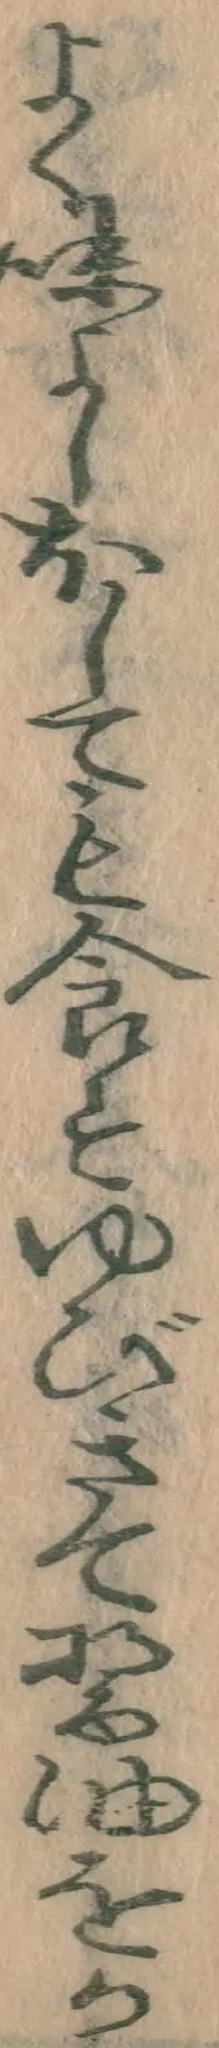よく味よしほしても食すゆびきて醤油をか
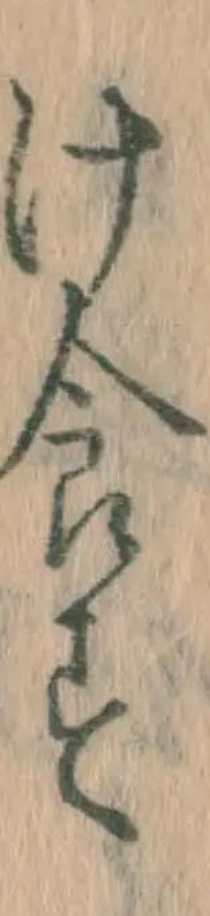け食す
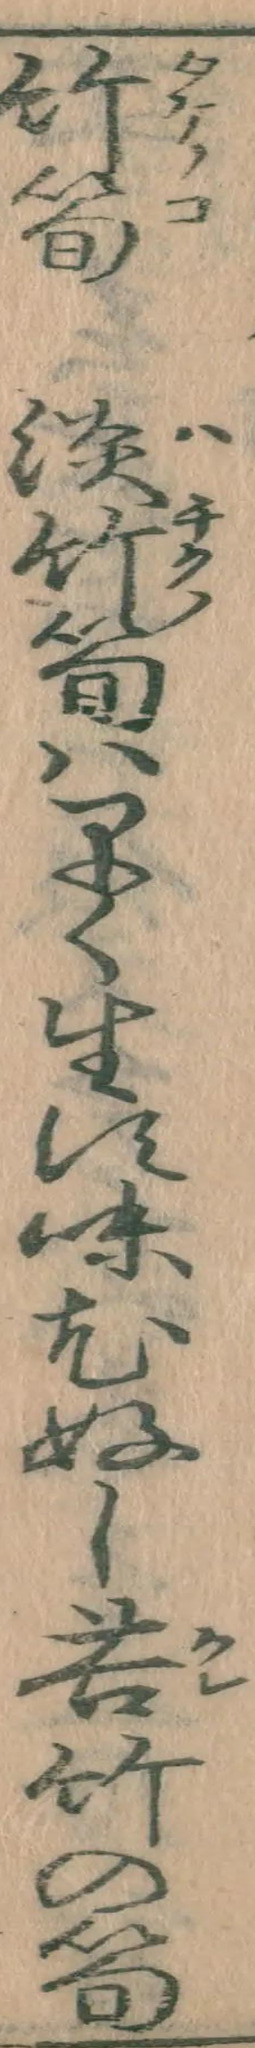竹筍淡竹筍は早く生す味尤好し苦竹の筍
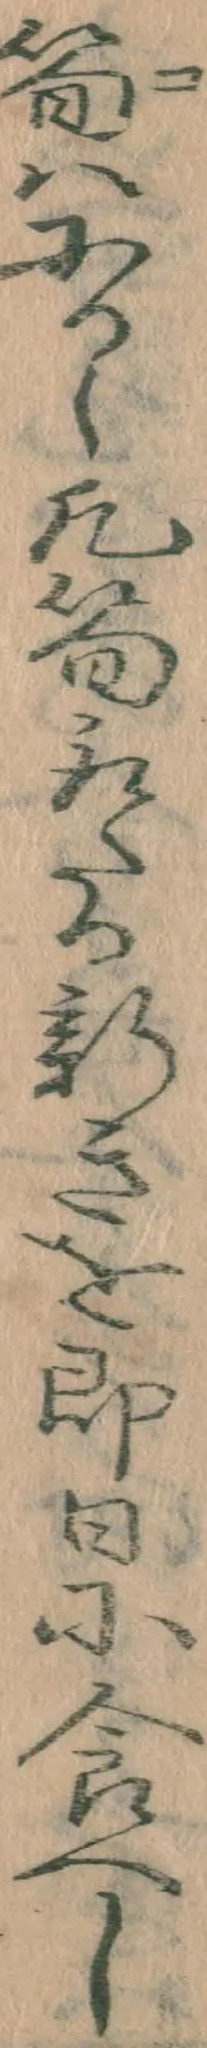筍はにかし凡筍取たる新きを即日に食へし
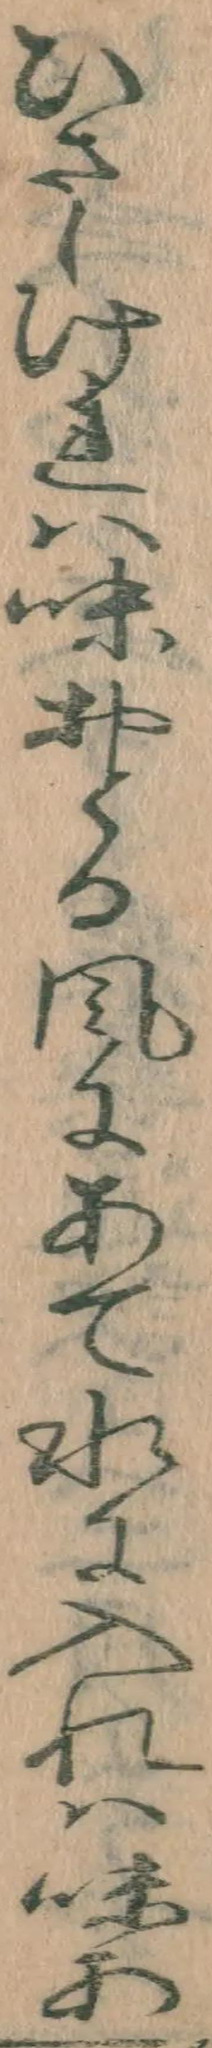ひさしけるは味おとる風にあて水に入れは味あ
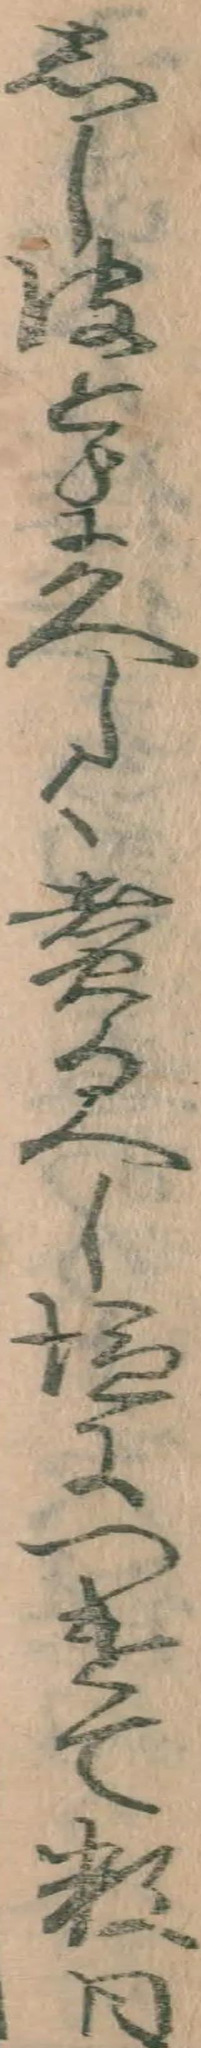しし皮ともに久しく煮るへし塩につけて数日
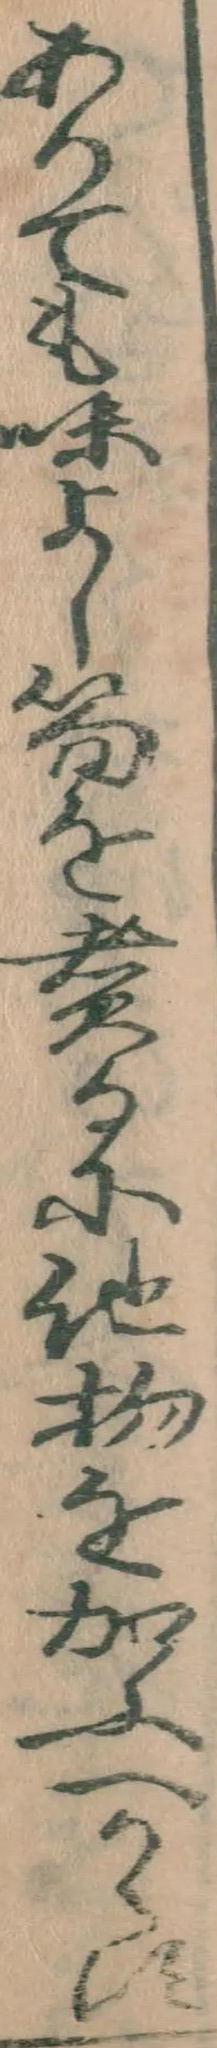ありても味よし筍を煮るに他物を加ふへからす
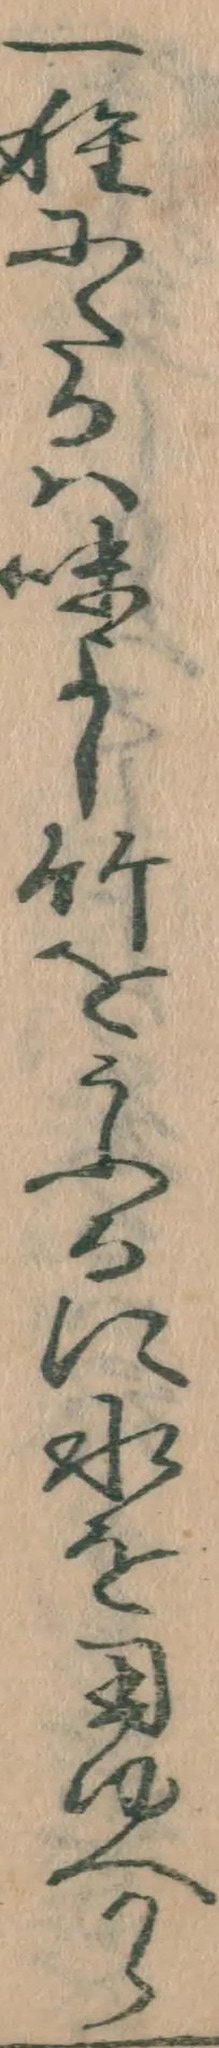一種にたるは味よし竹をうふるに水を用ゆへから
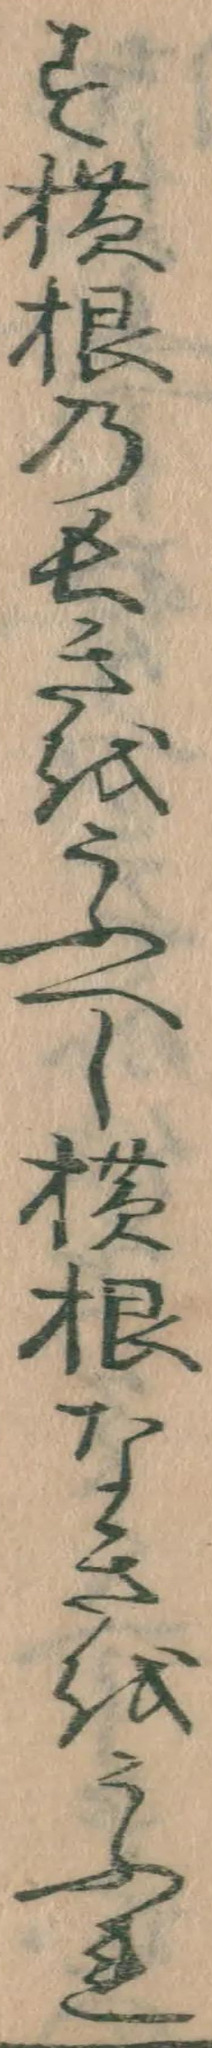す横根の長きをうふへし横根なきをうふれ
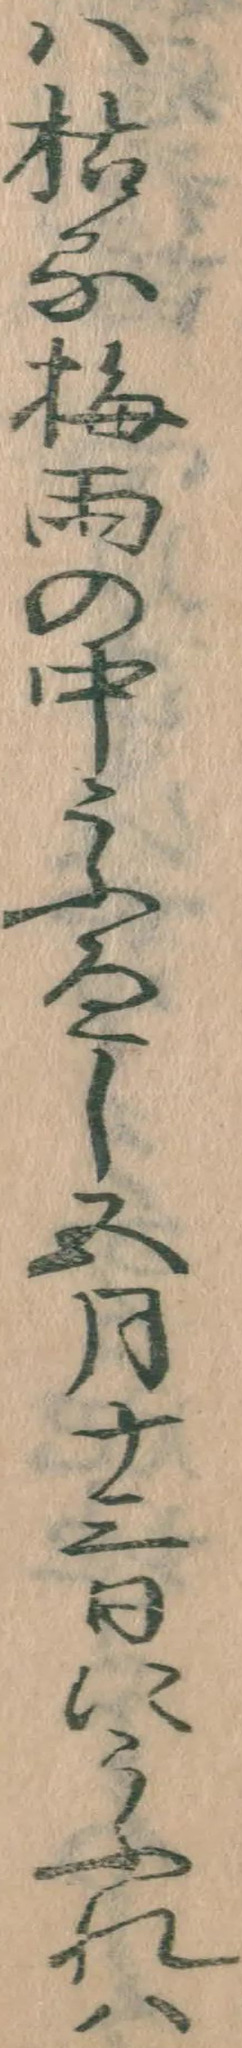は枯る梅雨の中うふへし五月十三日にうふれは
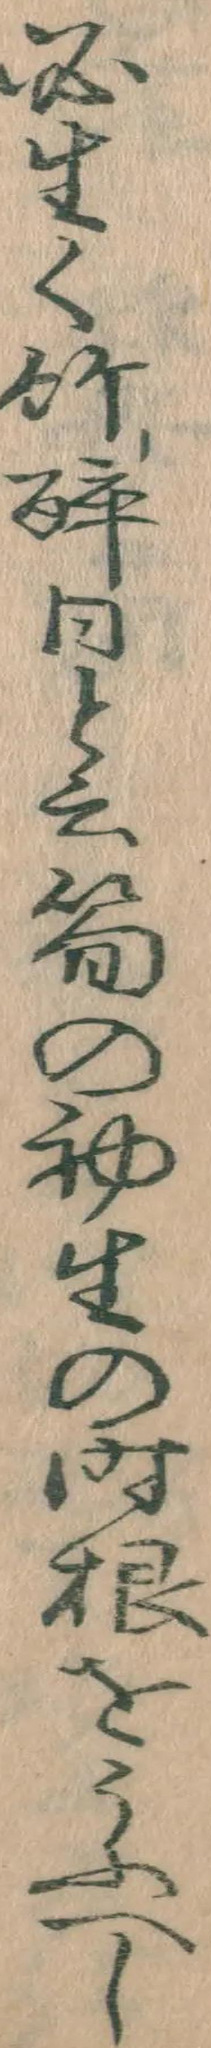必生く竹-酔日と云筍の初生の時根をうふへし
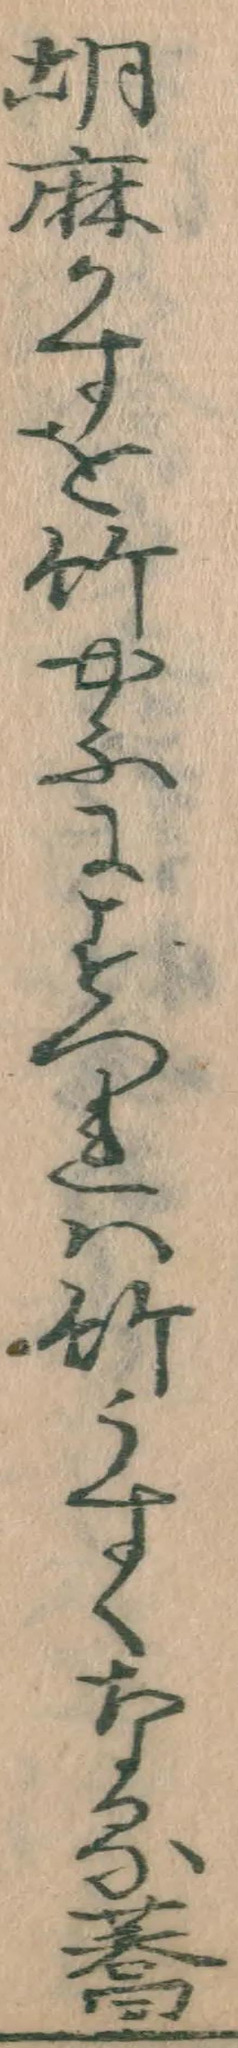胡麻かすを竹ゆふにすつれは竹うすくなる蕎
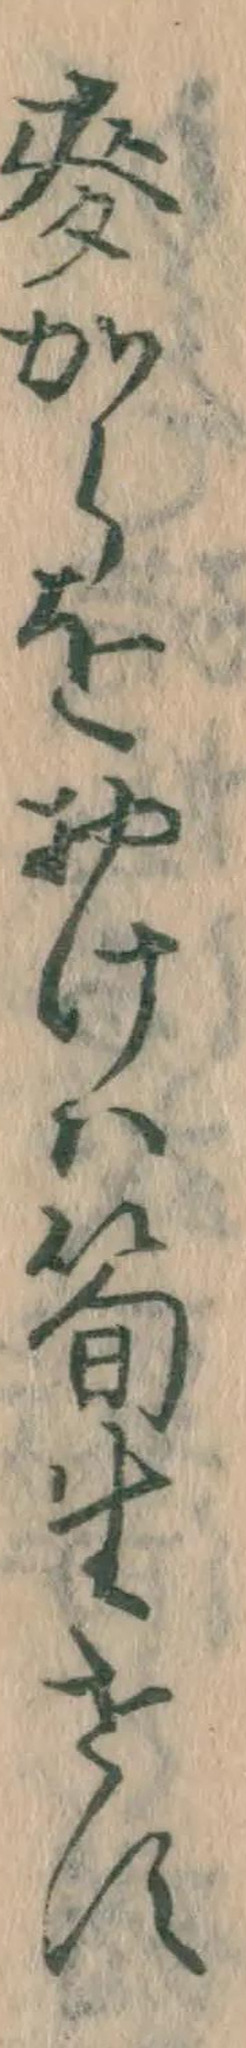麥からをおけは筍生せす
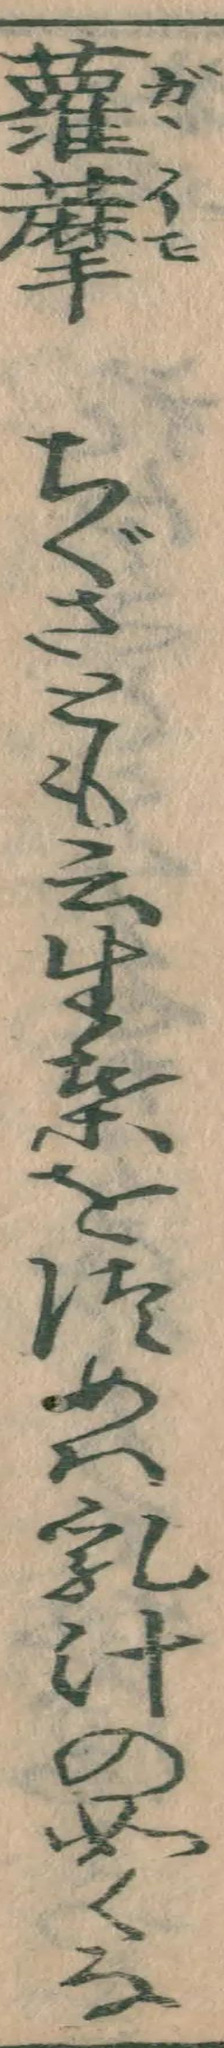蘿藦ちぐさとも云生葉をつめは乳汁の如くな
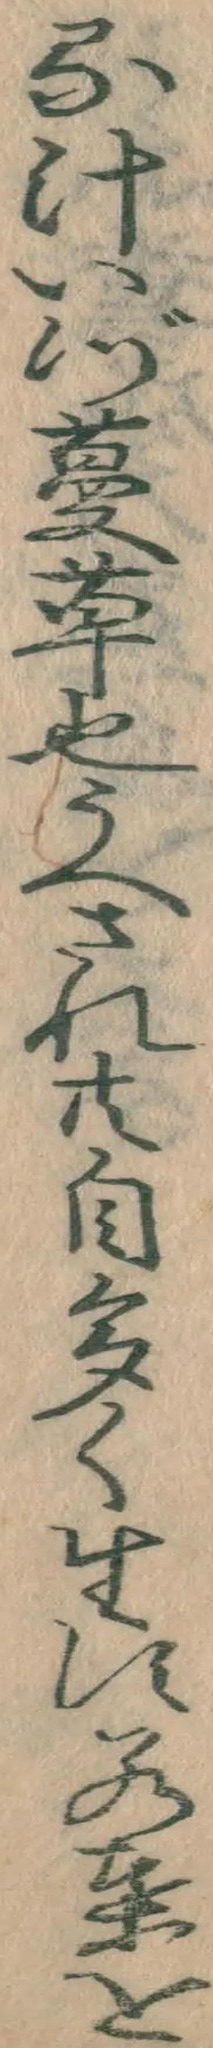る汁いづ蔓草也うへされ共自多く生す若葉を
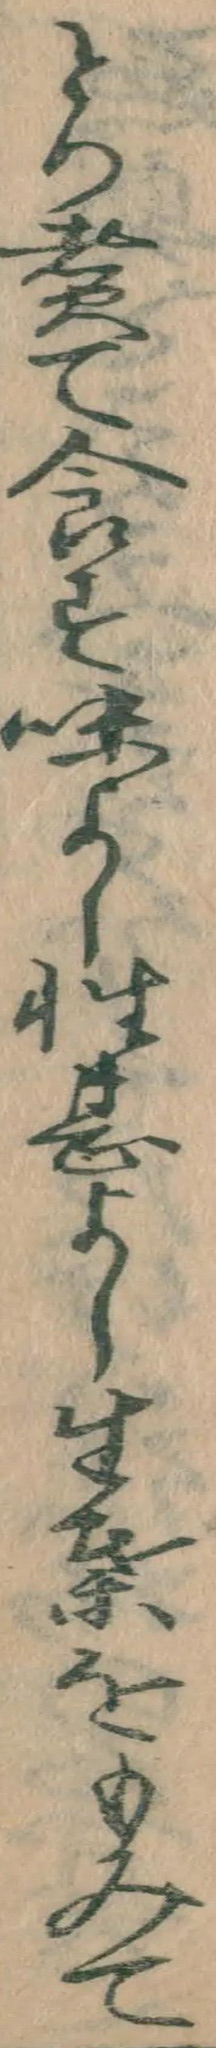とり煮て食す味よし性甚だよし生葉をもみて
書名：菜譜 3巻
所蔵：国立国会図書館 National Diet Library, JAPAN
